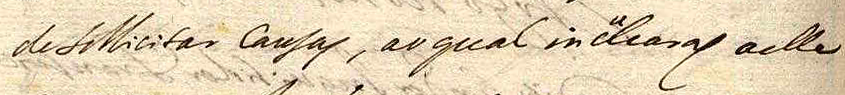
de sollicitar causas, ao qual inculcaraõ a elle
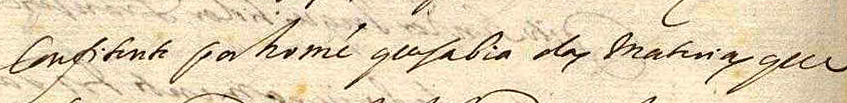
Confitente por homē que sabia das materias que
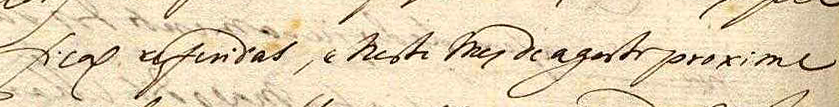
ficaõ referidas, e neste mes de agosto proxime
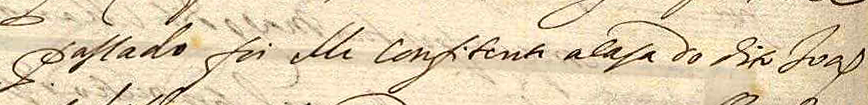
passado foi elle confitente a casa do dito Joaõ
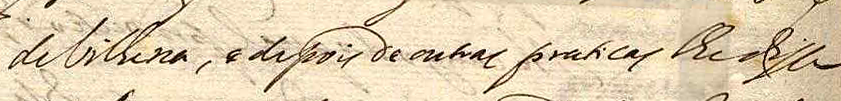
de Vilhena, e depois de outras praticas lhe disse
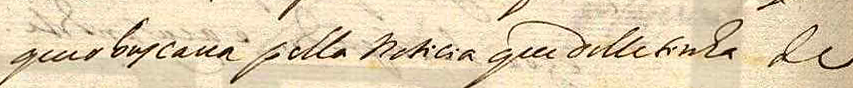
que o buscaua pella noticia que delle tinha de
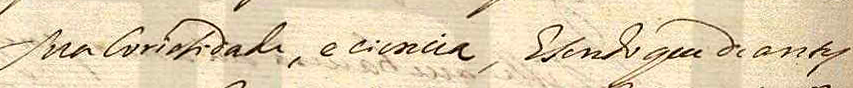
sua Coriosidade, e ciencia, E sendo que de antes
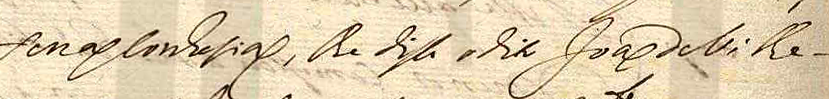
se naõ conhesiaõ, lhe disse o dito Joaõ de Vilhe
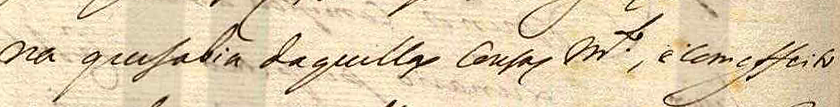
na que sabia daquellas cousas m.to, e com effeito
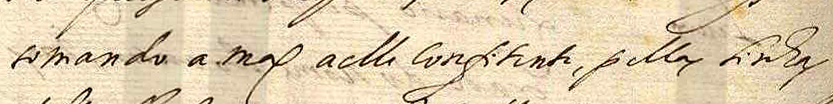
tomando a maõ a elle confitente, pellas linhas
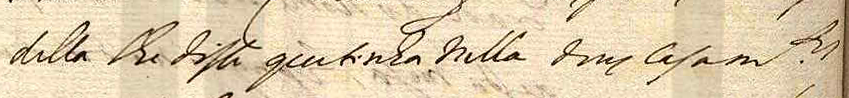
della lhe disse que tinha nella dous casam.tos
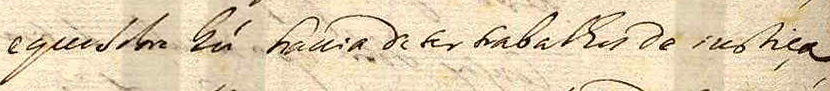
e que sobre hū hauia de ter trabalhos de iustiça
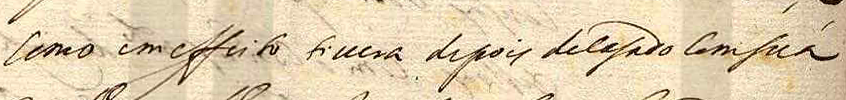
como em effeito tiuera depois de casado com sua
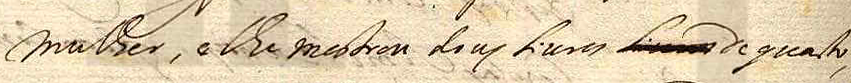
mulher, e lhe mostrou dous liuros Liuros de quarto,
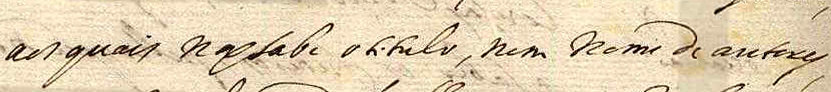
aos quais naõ sabe o titulo, nem nome de autores
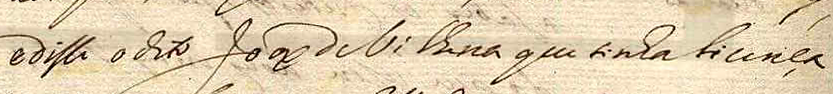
e disse o dito Joaõ de Vilhena que tinha licença
